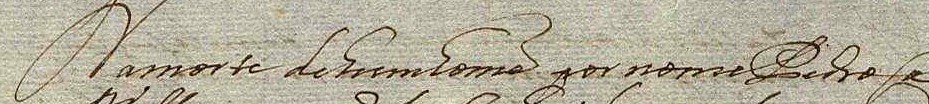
Na morte de hum homē por nome Pedro Ca
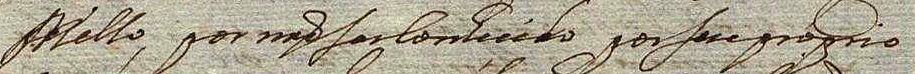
Mello, por naõ ser Conhecido por seu proprio
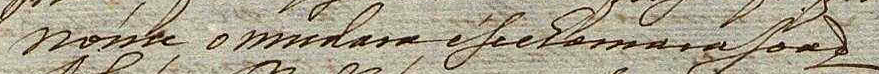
nome, o mudara, e se chamara Joaõ
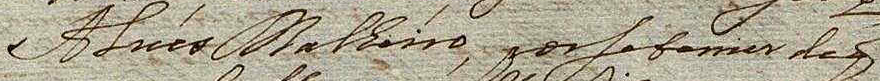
Alues Malheiro, por se temer de q̄
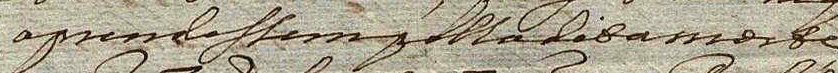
o prendessem pella dita morte
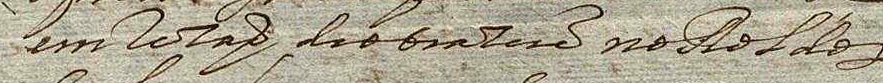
em Rezaõ de o trazerē no Rol dos
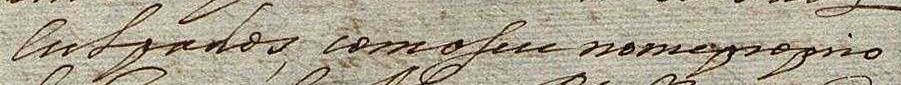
Culpados, com o seu nome proprio
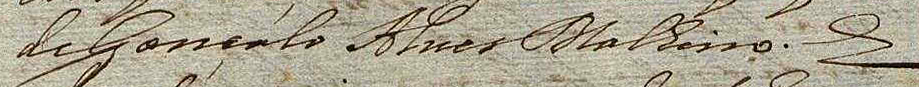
de Gonçalo Alues Malheiro. E
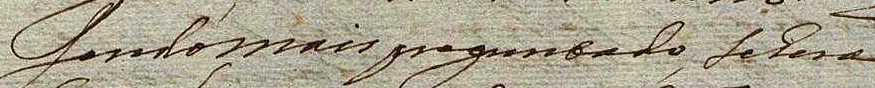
sendo mais preguntado, se hera
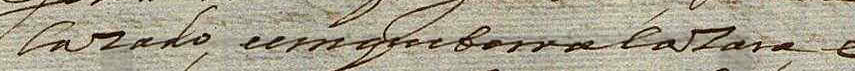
cazado, e em que terra cazara, e
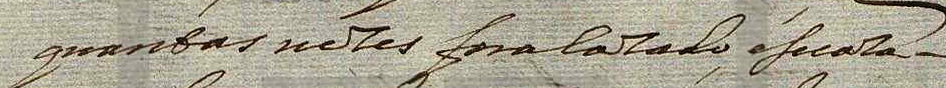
quantas uezes fora cazado, e se caza
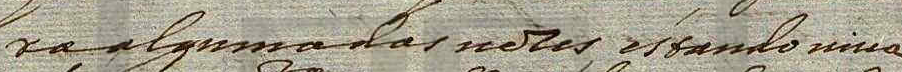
ra alguma das uezes, estando uiua
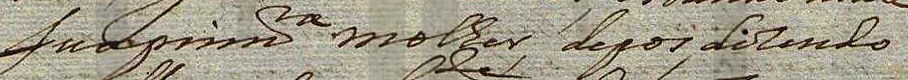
sua primra molher, depos, dizendo
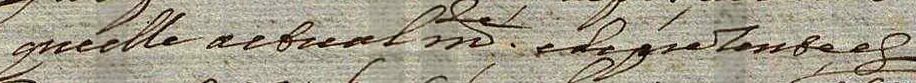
que elle actualm.te e de prezente, es
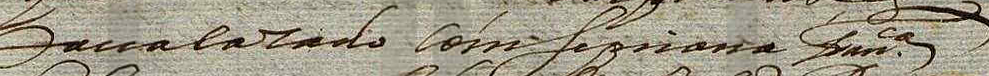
taua cazado com Sepriana Fran.ca
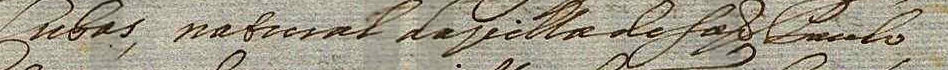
Cubas, natural da Villa de Saõ Paulo
